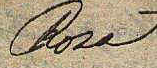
Roza
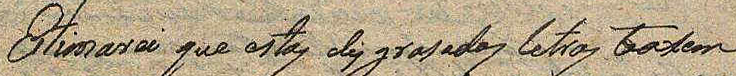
Estimarei que estas disgrasadas letras te axem
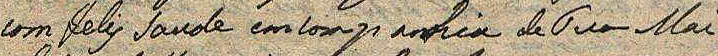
com felis saude em companhia de tua Mai
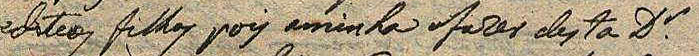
e de teos filhos pois a minha o fazer desta D.s
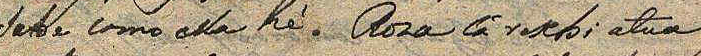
sabe como ella hé. Roza cá recebi a tua
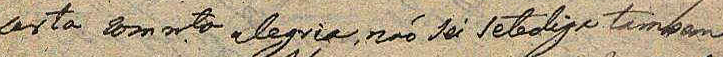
carta com m.ta alegria, naõ sei se te diga tambem
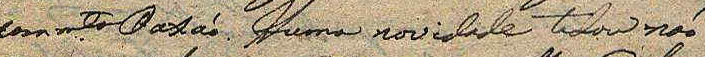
com m.ta Paxaõ. Huma novidade te dou naõ
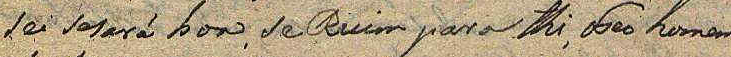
sei se será boa, se Ruim para thi, o seo homem
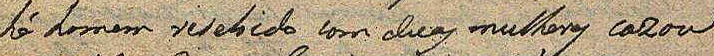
hé homem resebido com duas mulheres cazou
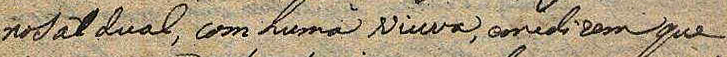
no sal dual, com huma viuva, e me dizem que
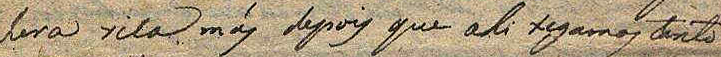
hera rica más depois que ali xegamos tanto
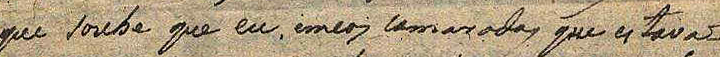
que soube que eu, e meos camaradas que estava
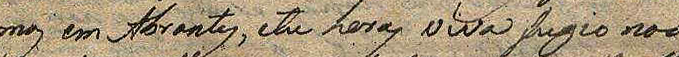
mos em Abrantes, tu heras viva fugio naõ
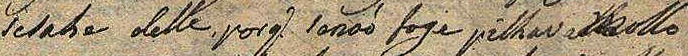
se sabe delle, porq̄. se naõ foge pilhava sollo
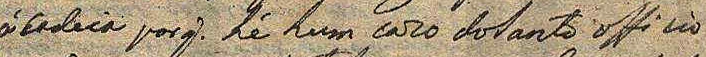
á cadeia porq̄. hé hum cazo do Santo officio
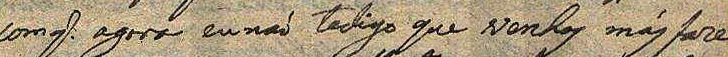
com q̄. agora eu naõ te digo que venhas más faze
